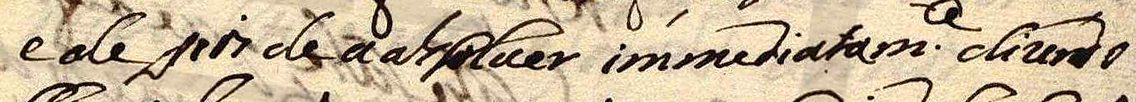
e depois de a absoluer immediatam.te dizendo
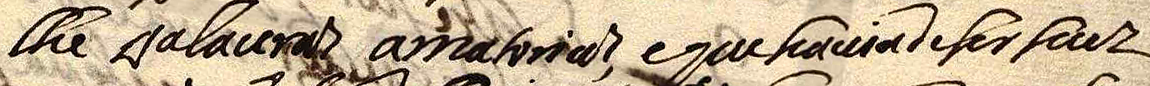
lhe palavras amatorias, e que hauia de ser seuz
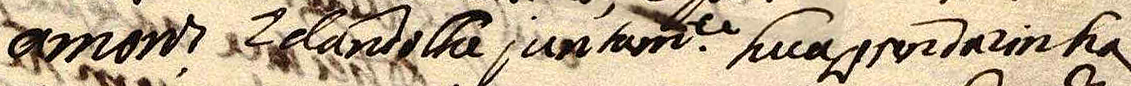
amores, zelandolhe juntam.te hua prendazinha
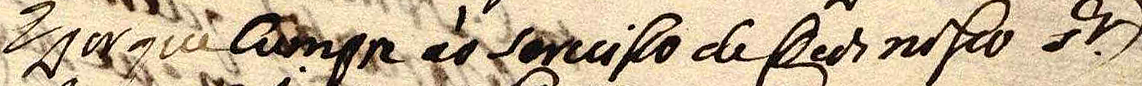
E porque cumpre áo seruisso de Deos nosso s.or
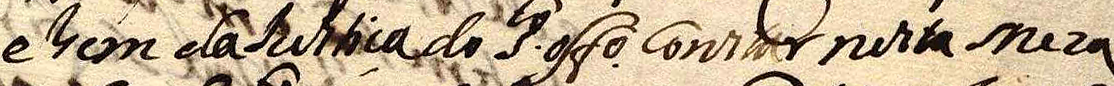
e bem da Iustiça do s.to offo. constar nesta meza
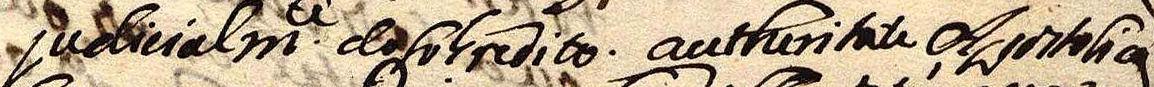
judicialm.te do sobredito. authoritate Apostolica
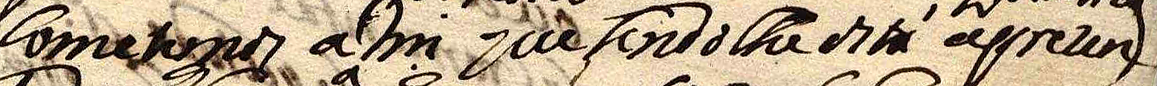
Cometemos adm que sendolhe esta aprezen
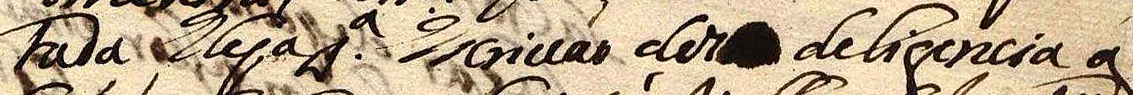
tada Eleja p.a Escriuaõ des_ deligencia a
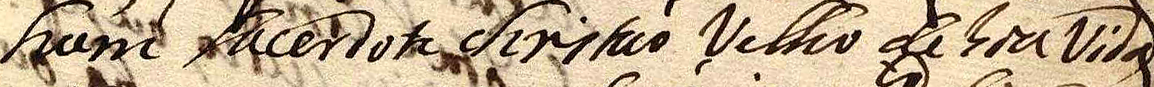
hum sacerdote christaõ Velho de boa Vida
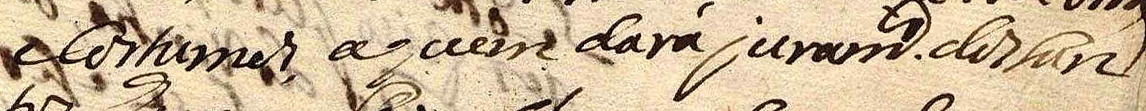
e Costumes, a quem dará juram.to dos san
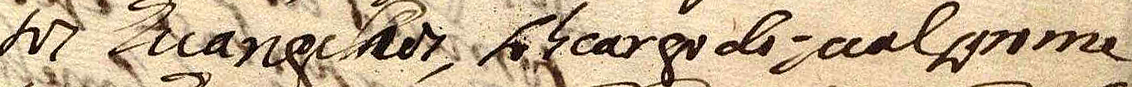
tos Euangelhos, sobcargo do qual prome
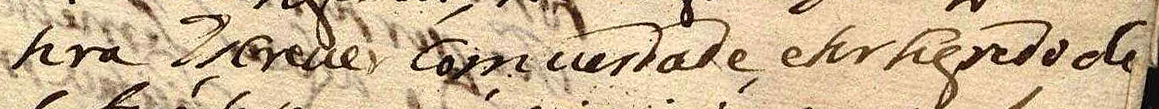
tera Escreuer com uerdade, e ter segredo de
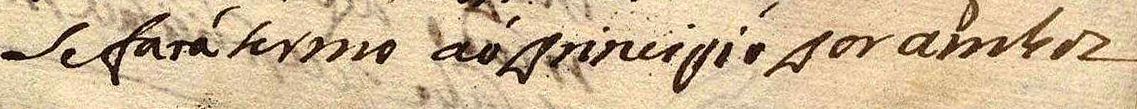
se fará termo ao principio por amboz
